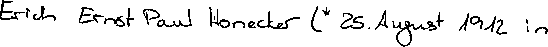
Erich Ernst Paul Honecker (* 25. August 1912 in
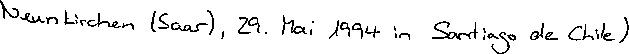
Neunkirchen (Saar); 29. Mai 1994 in Santiago de Chile)
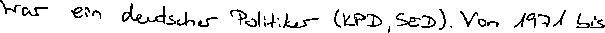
War ein deutscher Politiker (KPD, SED). Von 1971 bis
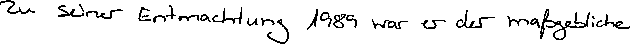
zu seiner Entmachtung 1989 war er der maßgebliche
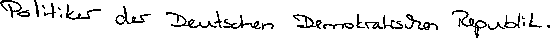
Politiker der Deutschen Demokratischen Republik.
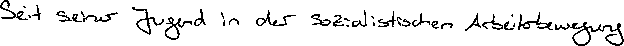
Seit seiner Jugend in der sozialistischen Arbeiterbewegung
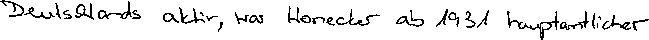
Deutschlands aktiv, war Honecker ab 1931 hauptamtlicher
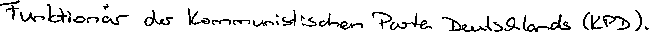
Funktionär der Kommunistischen Partei Deutschlands (KPD).
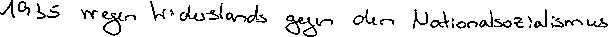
1935 wegen Widerstands gegen den Nationalsozialismus
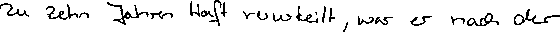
zu zehn Jahren Haft verurteilt, war er nach der
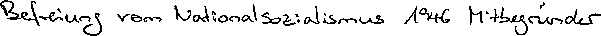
Befreiung vom Nationalsozialismus 1946 Mitbegründer
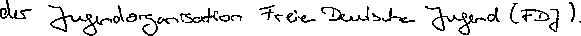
der Jugendorganisation Freie Deutsche Jugend (FDJ).
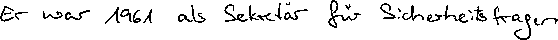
Er war 1961 als Sekretär für Sicherheitsfragen
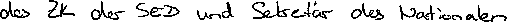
des ZK der SED und Sekretär des Nationalen
